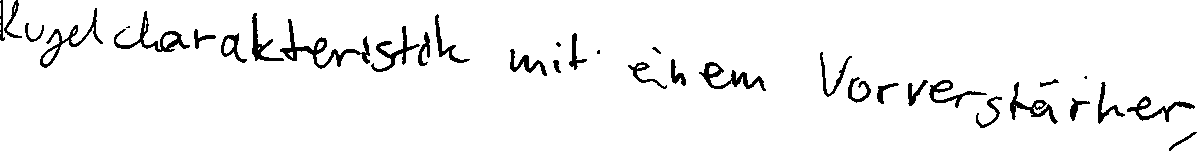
Kugelcharakteristik mit einem Vorverstärker,
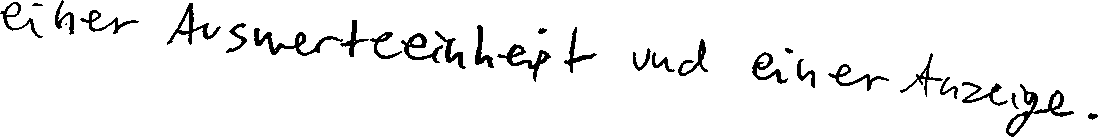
einer Auswerteeinheit und einer Anzeige.
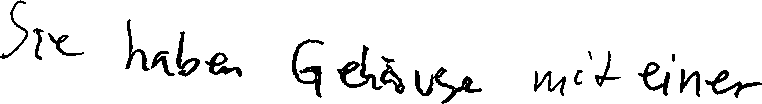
Sie haben Gehäuse mit einer
